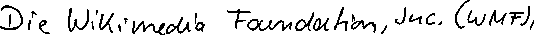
Die Wikimedia Foundation, Inc. (WMF),
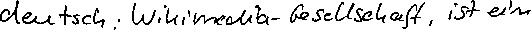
deutsch: Wikimedia-Gesellschaft, ist ein
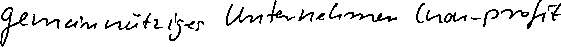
gemeinnütziges Unternehmen (non-profit
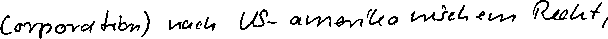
corporation) nach US-amerikanischem Recht,
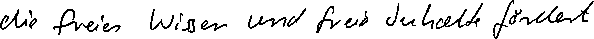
die freies Wissen und freie Inhalte fördert
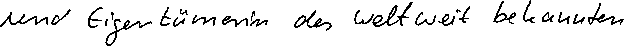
und Eigentümerin des weltweit bekannten
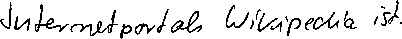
Internetportals Wikipedia ist.
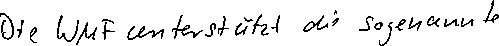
Die WMF unterstützt die sogenannte
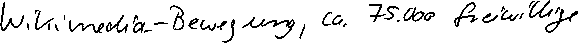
Wikimedia-Bewegung, ca. 75.000 freiwillige
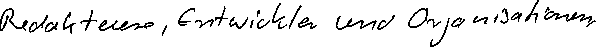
Redakteure, Entwickler und Organisationen,
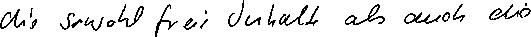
die sowohl freie Inhalte als auch die
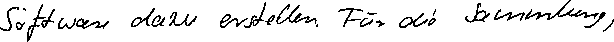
Software dazu erstellen. Für die Sammlung,
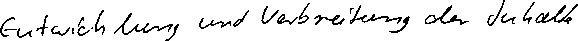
Entwicklung und Verbreitung der Inhalte
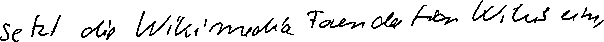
setzt die Wikimedia Foundation Wikis ein,
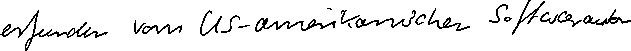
erfunden vom US-amerikanischen Softwareautor
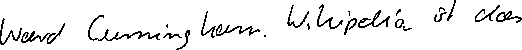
Ward Cunningham. Wikipedia ist das
